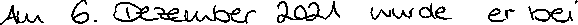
Am 6. Dezember 2021 wurde er bei
